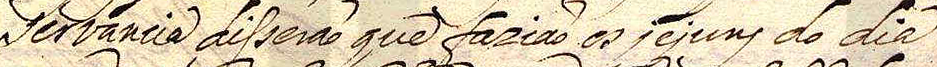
servancia disseraõ que faziaõ os jejuns do dia
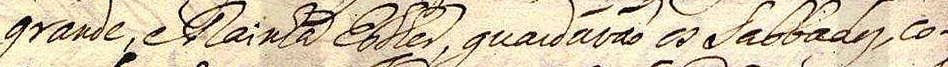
grande, e Rainha Esther, guardavaõ os Sabbados, co
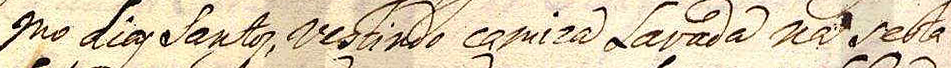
mo dias santos, vestindo camiza Lavada na sesta
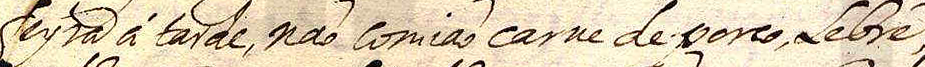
feyra á tarde, naõ comiaõ carne de porco, Lebre,
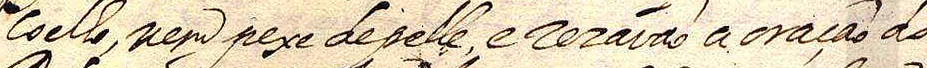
coelho, nem pexe de pelle, e rezavaõ a oração do
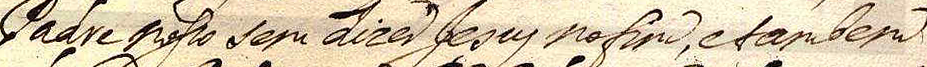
Padre nosso sem dizer Jesus no fim, e tambem
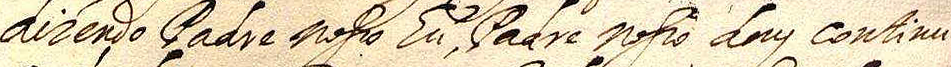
dizendo Padre nosso hū, Padre nosso dous continu
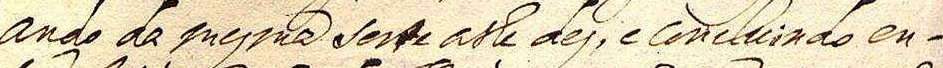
ando da mesma sorte athe des, e concluindo en
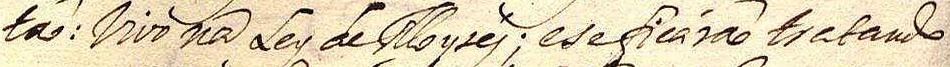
taõ: vivo na Ley de Moyzés; e se ficaraõ tratando
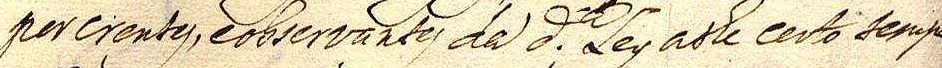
per crentes, e observantes da d.a Ley athe certo tempo.
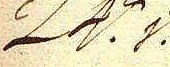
24.a t.a
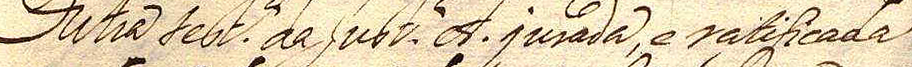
Outra test.a da Just.a A. jurada, e ratificada
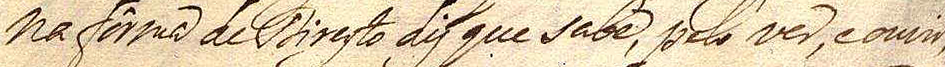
na fôrma de Direyto dis que sabe, pelo ver, e ouvir
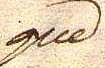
que
